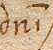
dnī /
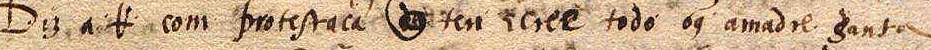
Diz a R com protestaçā q̄ ten E cree todo o q̄ a madre Santa
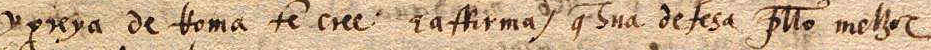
Ygreya de Roma tē cree. E affirma / q̄ sua defesa p̄llo melhor
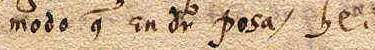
modo q̄ En drto posa / he.
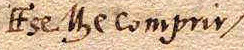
E se lhe comprir /
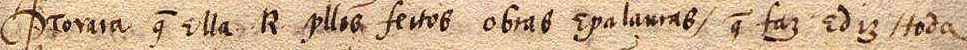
Provara q̄ Ella R pllos̄ feitos obras E palauras / q̄ faz E diz / toda
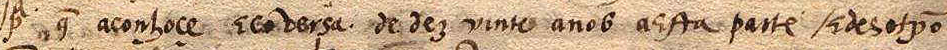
pa q̄ a conhoçe E cōversa. de dez vinte anos a Esta parte / E des o tpō
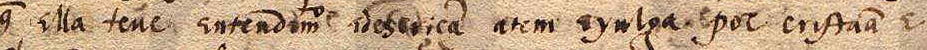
q̄ Ella teue Entendimto e descriçā a tem E yulga. por cristaā E
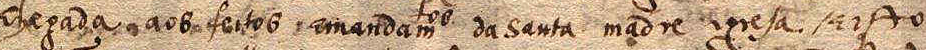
chegada aos feitos E mandamtos da santa madre igreja / E isto
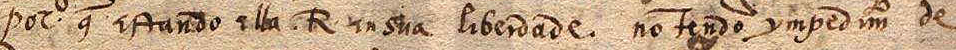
por q̄ Estando Ella .R. En sua liberdade. nō tendo ympedimto de
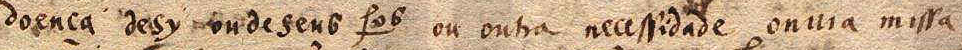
doença de sy ou de seus fos ou outra neçessidade ouuia missa
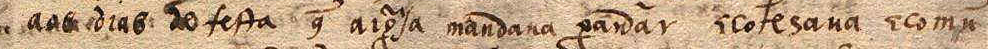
aos dias de festa q̄ a iḡja mandaua gardar E cōfesaua e comū
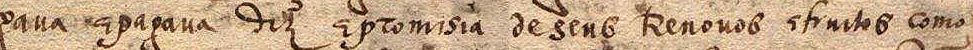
gaua E pagaua dizo E promisia de seus Renouos E fruitos como
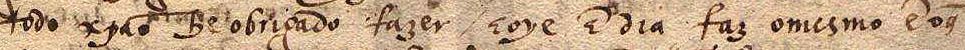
todo xpão he obrigado fazer / E oye Ē dia faz o mesmo ē o q̄
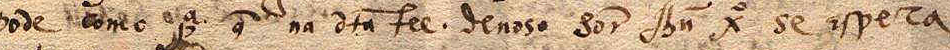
pode como pa q̄ na dtā fee. de noso Sōr Jhū xo se Espera
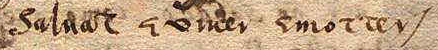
Saluar E viuer E morrer /
